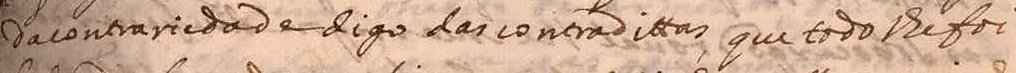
da contrariedade digo das contradittas, que todo lhe foi
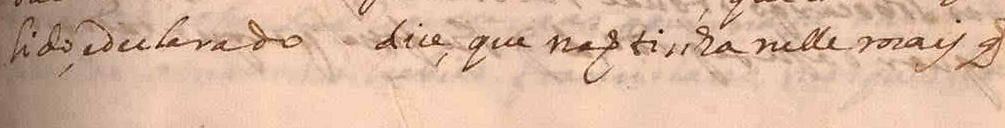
lido, e declarado dice, que naõ tinha nelle mais q̄
